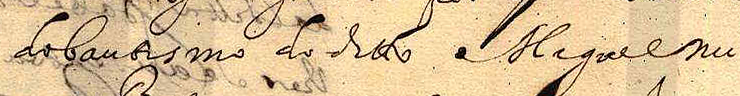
do bautismo do ditto Miguel nu
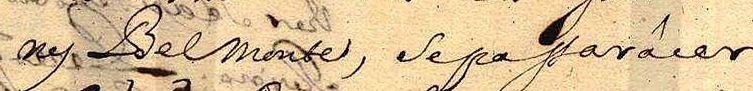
nes Belmonte, se passarâa cer
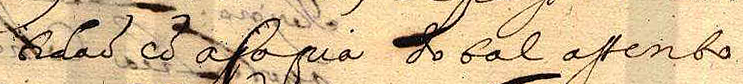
tidaõ cō a Copia do tal assento
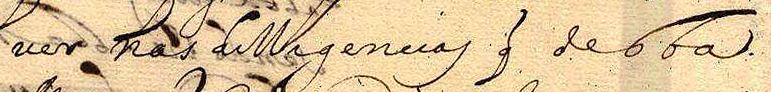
uer nas dilligencias q̄ desta
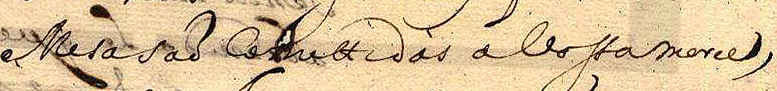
Mesa saõ comettidas a Vossa merce,
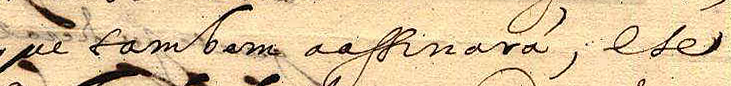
que tambem a assinará, e se
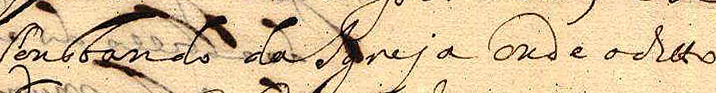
Constando da Igreja, onde o ditto
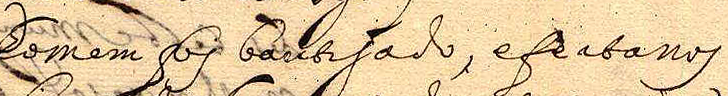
homem foy bautisado, e feita nos
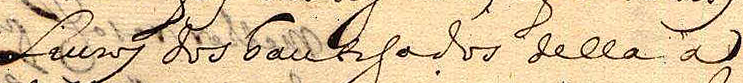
Liuros dos bautisados della a
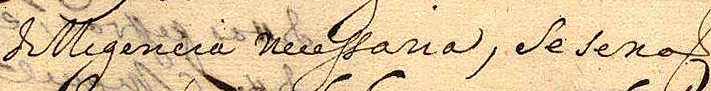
dilligencia necessaria, se se naõ
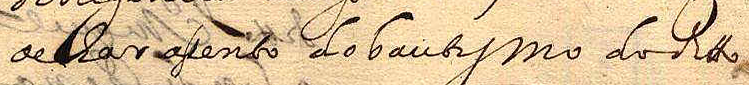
achar assento do bautismo do ditto
